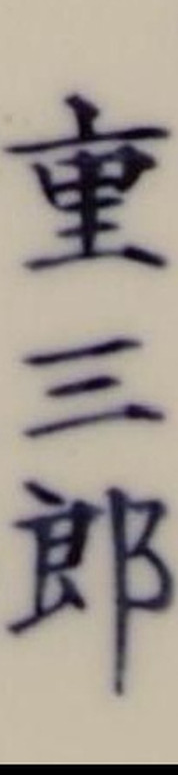重三郎
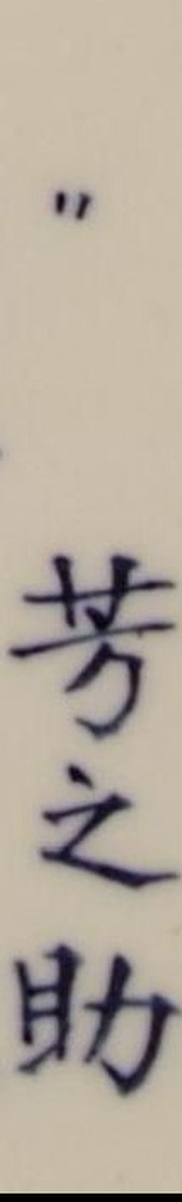芳之助
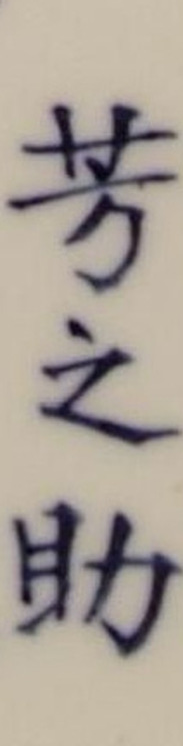芳之助
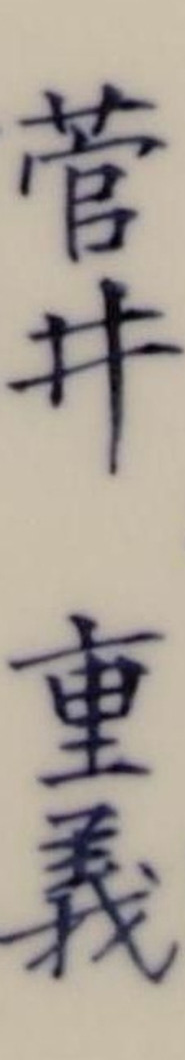菅井重義
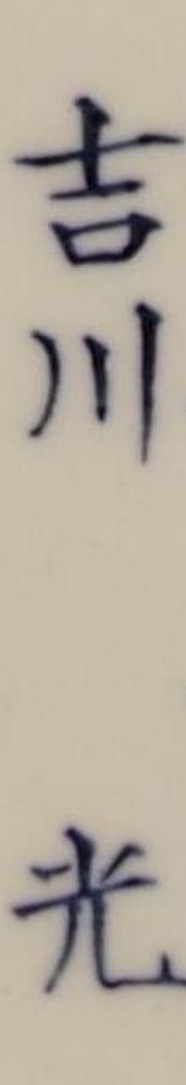吉川光
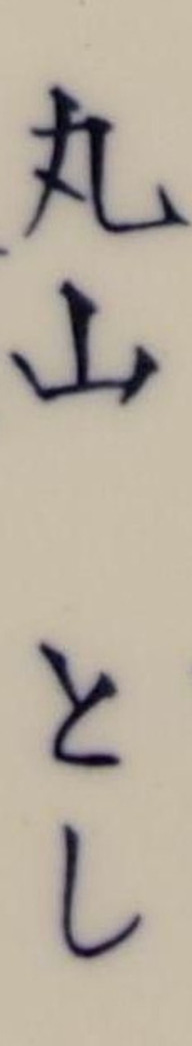丸山とし
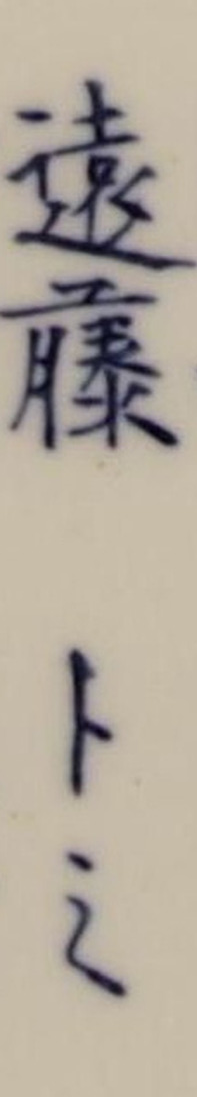遠藤トミ
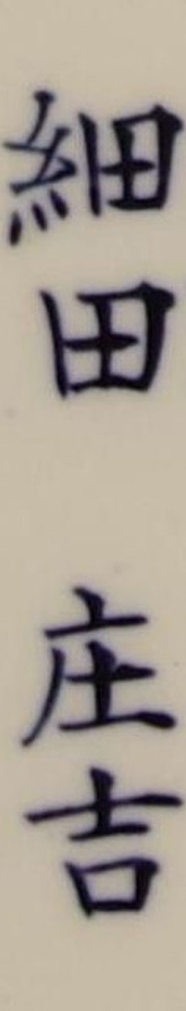細田庄吉
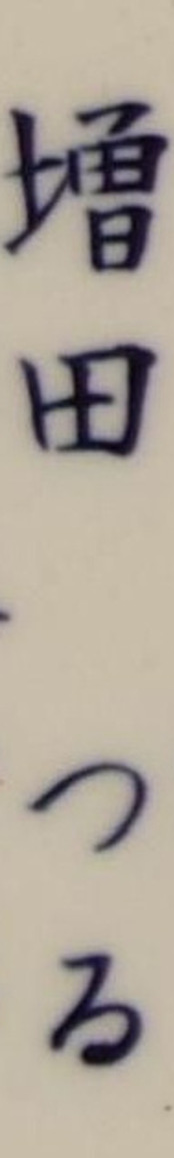増田つる
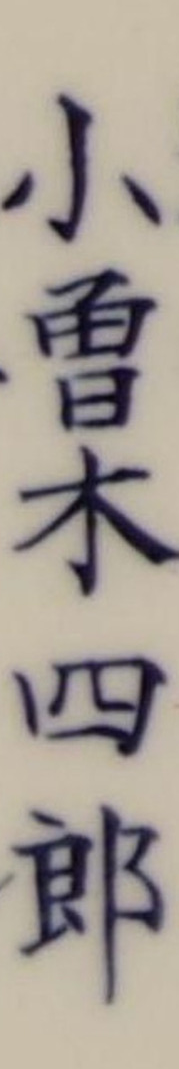小曽木四郎
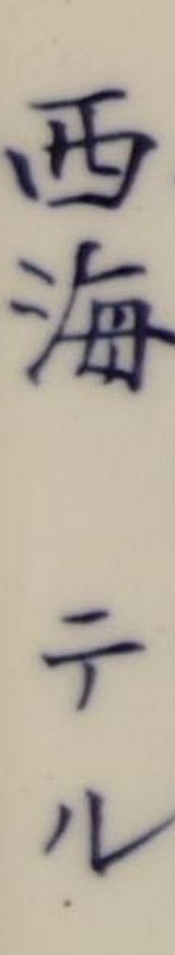西海テル

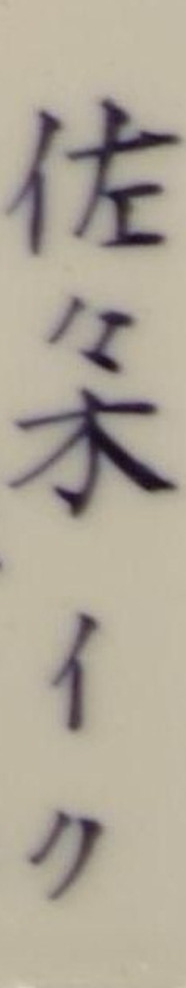佐々木イク
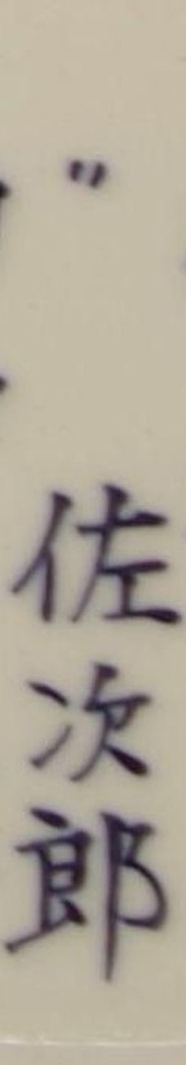佐次郎
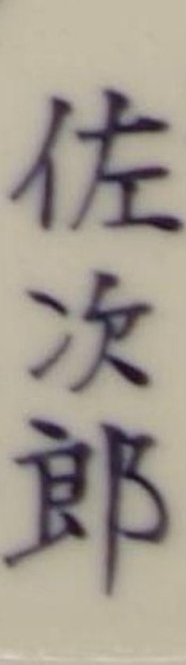佐次郎
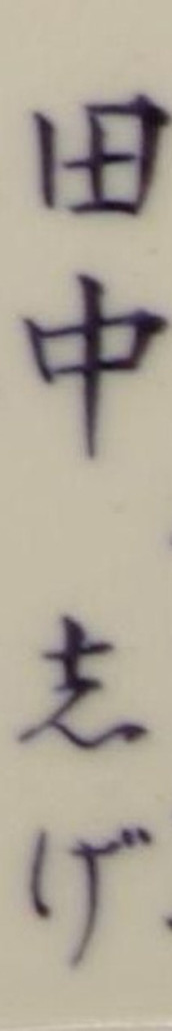田中しげ
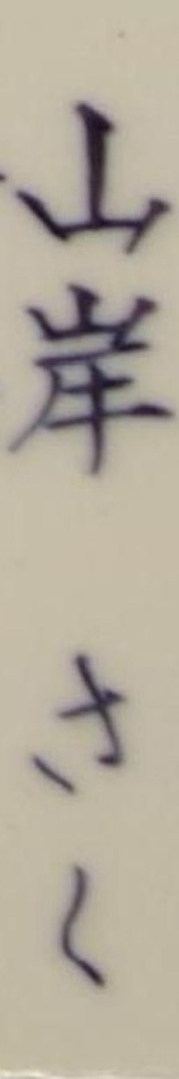山岸さく
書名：E~L
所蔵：高野山金剛峯寺
